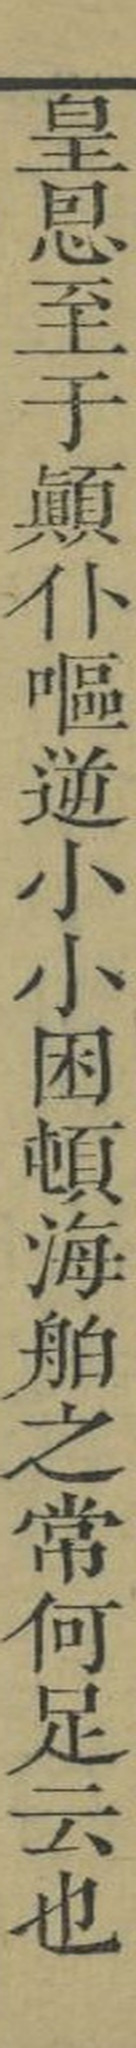皇㤙至于顚仆嘔逆小小困頓海舶之常何足云也
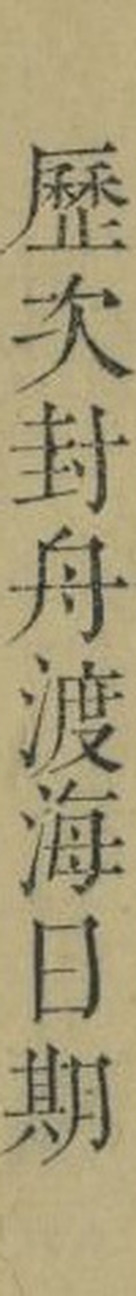歷次封舟渡海日期
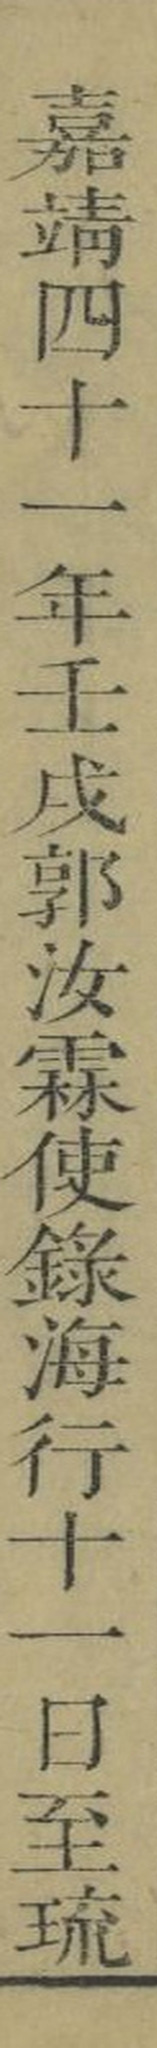嘉靖四十一年壬戌郭汝霖使錄海行十一日至琉

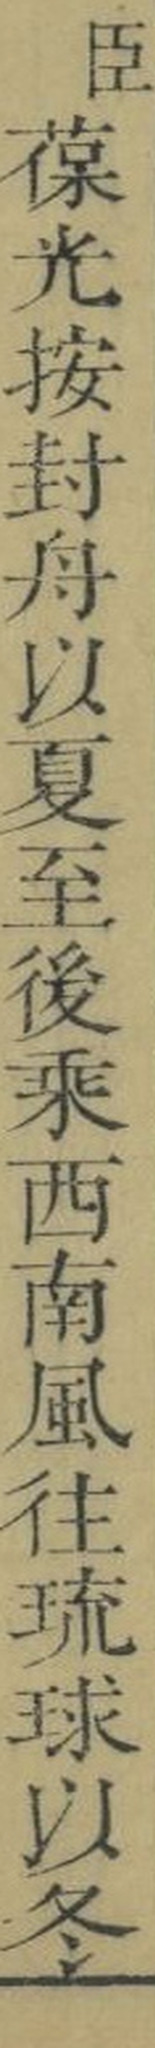臣葆光按封舟以夏至後乘西南風往琉球以冬
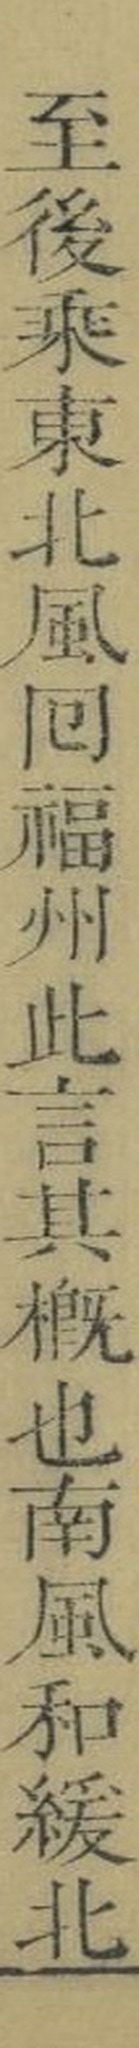至後乘東北風囘福州此言其槪也南風和緩北
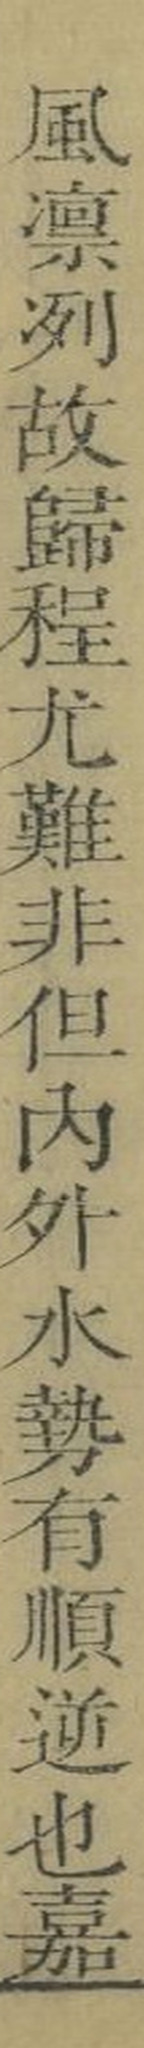風凛冽故歸程尤難非但内外水勢有順逆也嘉
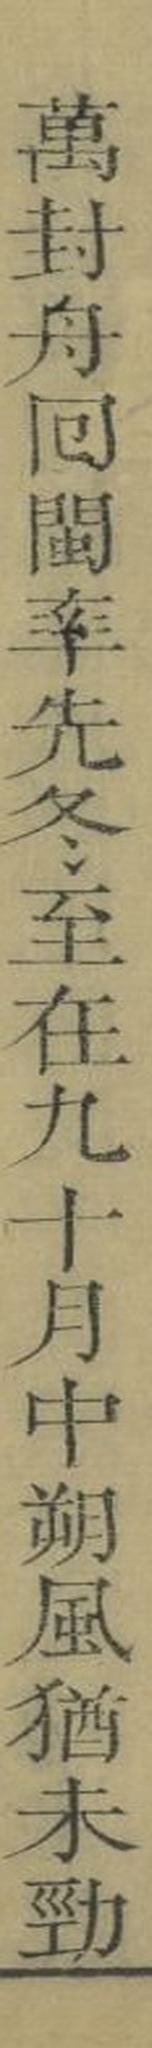萬封舟囘閩率先冬至在九十月中朔風猶未勁
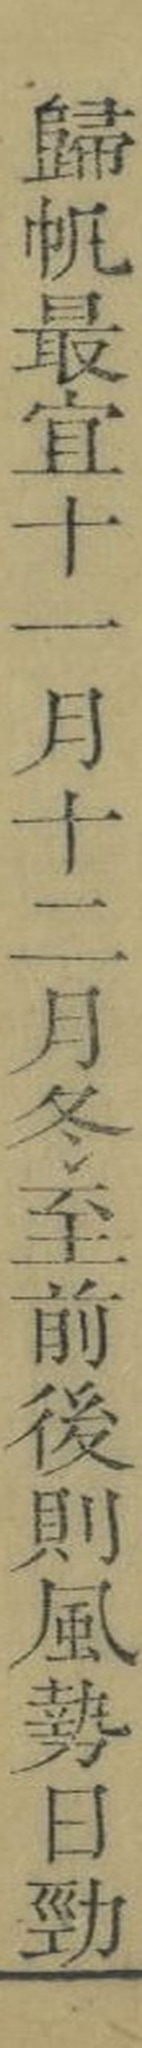歸帆最宜十一月十二月冬至前後則風勢日勁
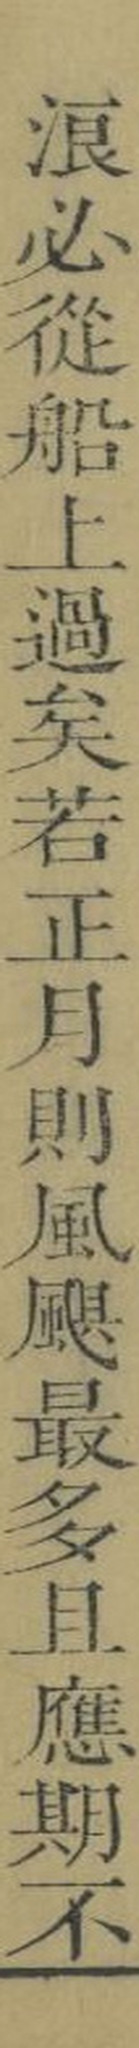浪必從船上過矣若正月則風颶最多且應期不

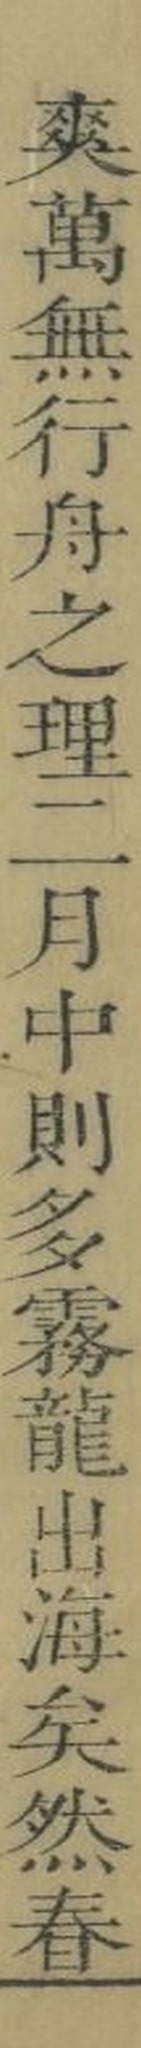爽萬無行舟之理二月中則多霧龍出海矣然春
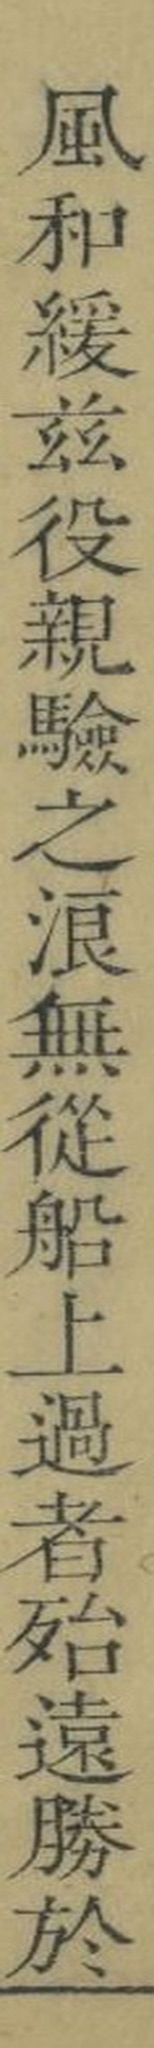風和緩茲役親驗之浪無從船上過者殆遠勝於
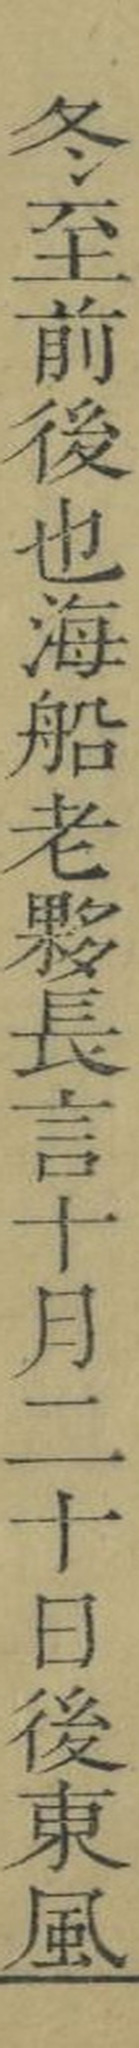冬至前後也海船老夥長言十月二十日後東風
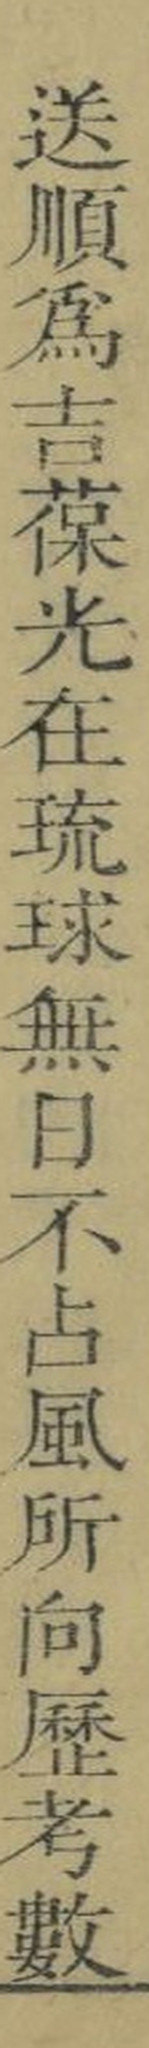送順爲吉葆光在琉球無日不占風所向歷考數
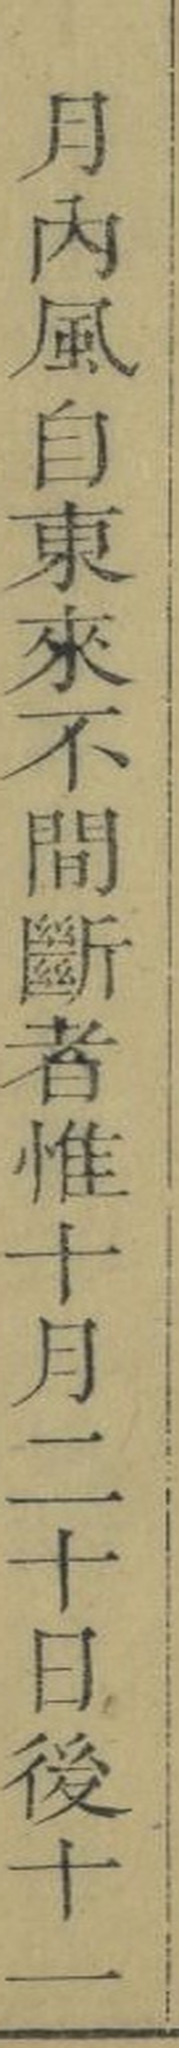月内風自東來不間斷者惟十月二十日後十一
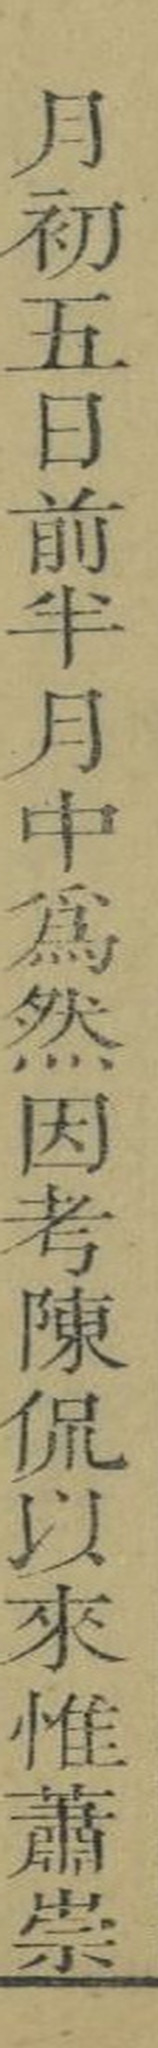月初五日前半月中爲然因考陳侃以來惟蕭崇
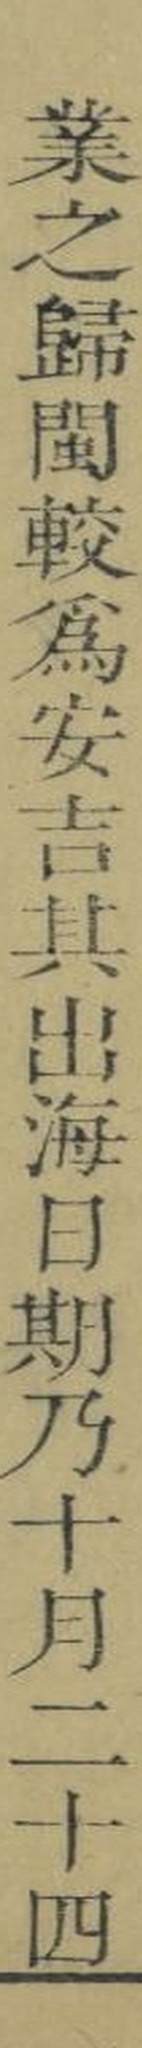業之歸閩較爲安吉其出海日期乃十月二十四
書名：中山伝信録 巻一
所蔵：University of the Ryukyus Library
